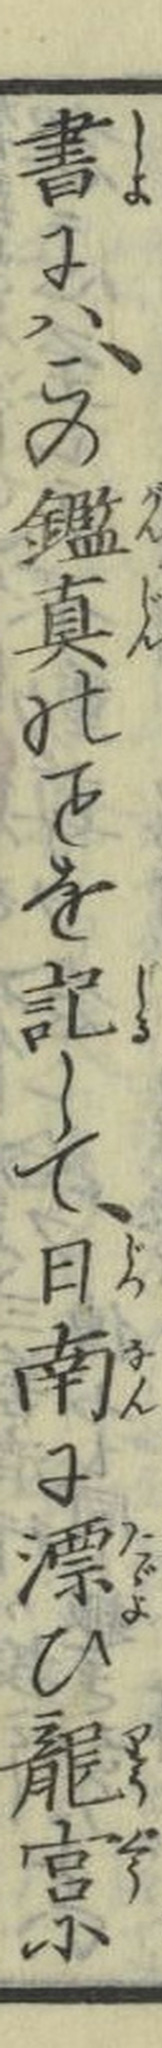書には、この鑑真のことを記して、日南に漂ひ竜宮に
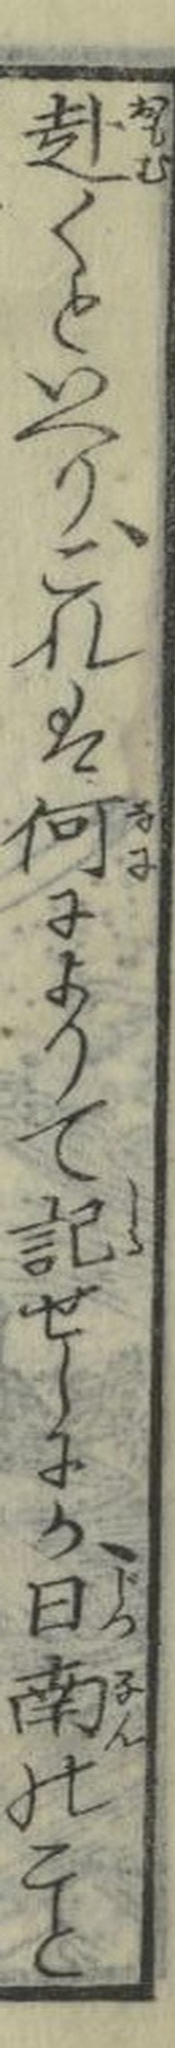赴くといへり、これは何によりて記せしにか、日南のこと
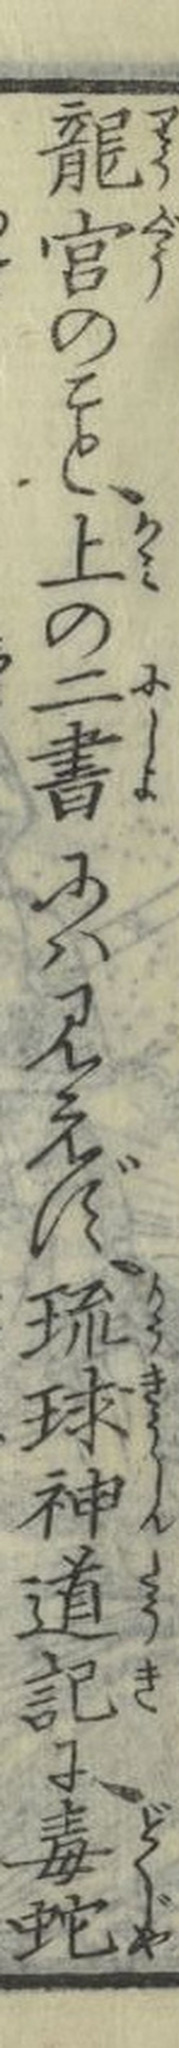竜宮のこと、上の二書には見えず琉球神道記に、毒蛇
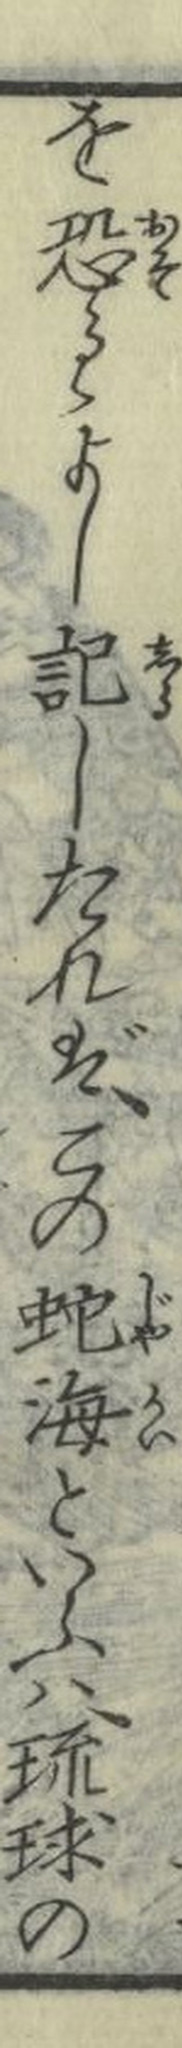を恐るゝよし記したれば、この蛇海といふは、琉球の
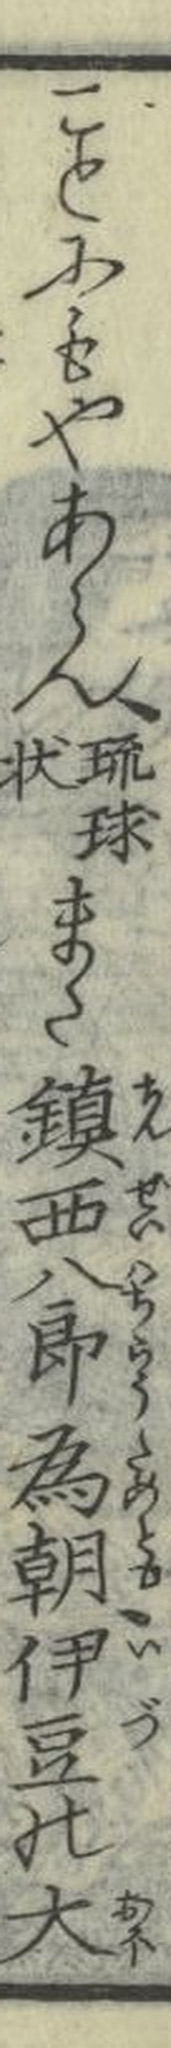ことにもやあらん、琉球状また鎮西八郎為朝、伊豆の大
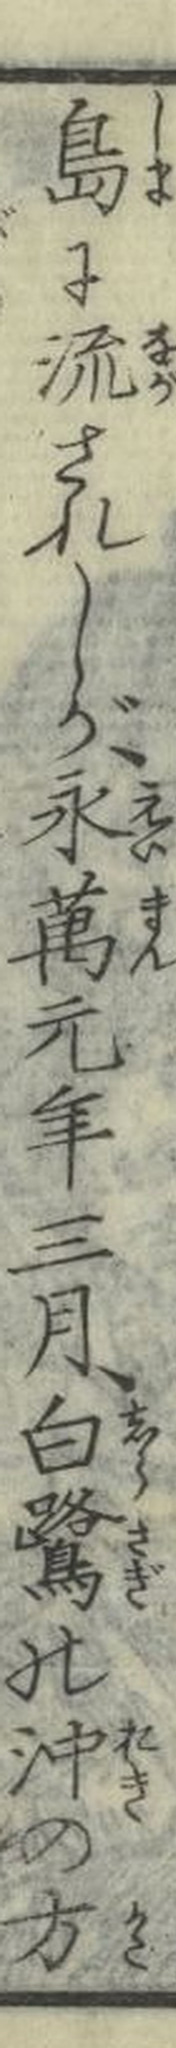島に流されしが、永万元年三月、白鷺の沖の方
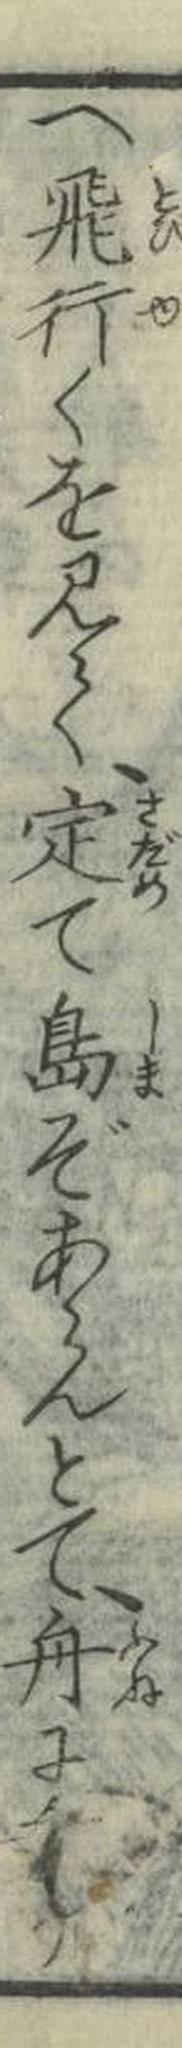へ飛行くを見て、定て島ぞあらんとて、舟に乗り
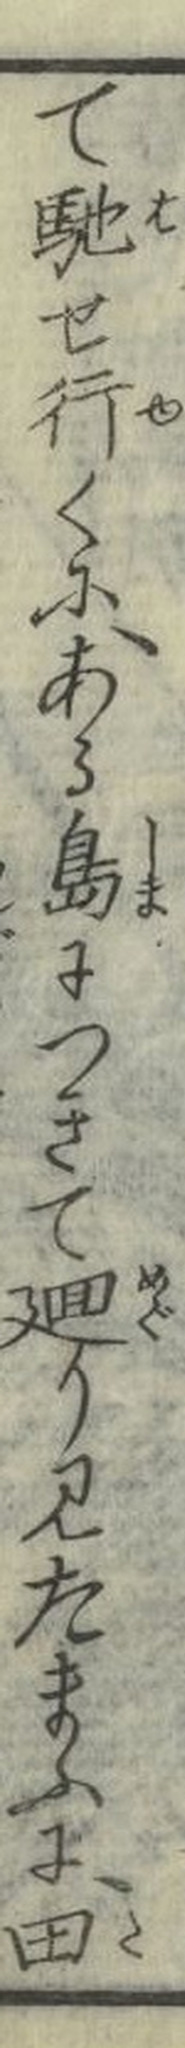て馳せ行くに、ある島につきて廻り見たまふに、田
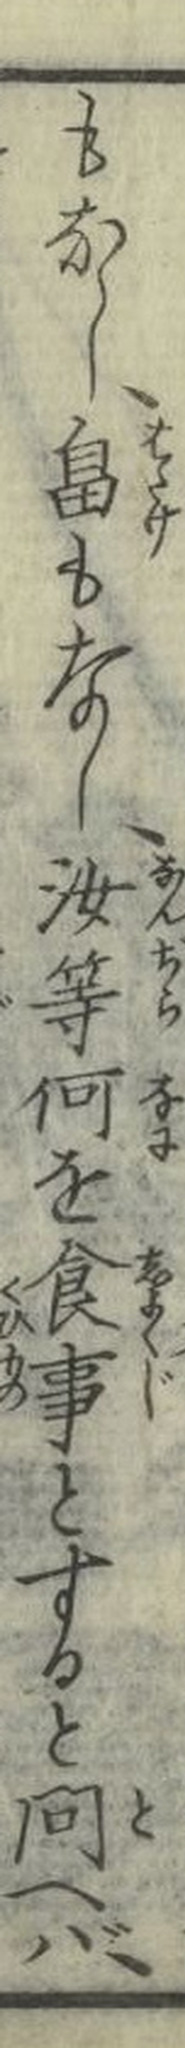もなし、畠もなし、汝等何を食事とすると問へば、
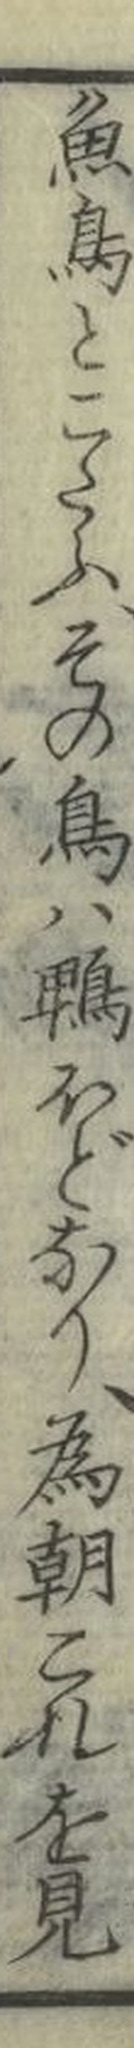魚鳥とこたふ、その鳥は鵯ほどなり、為朝これを見

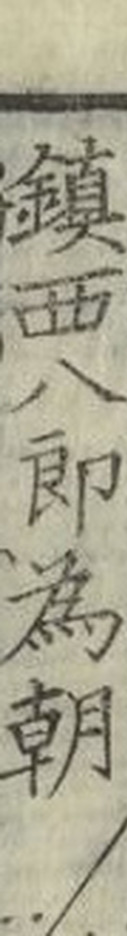鎮西八郎為朝
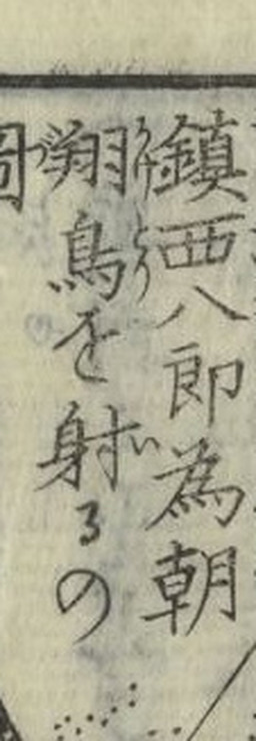翔鳥を射るの
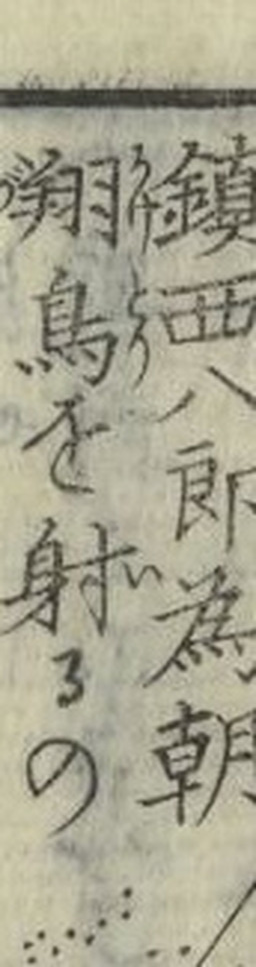翔鳥を射るの

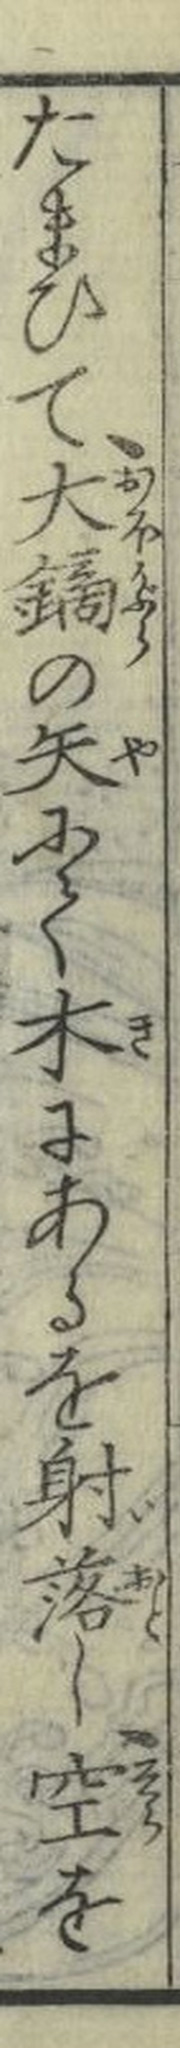たまひて、大鏑の矢にて木にあるを射落し、空を
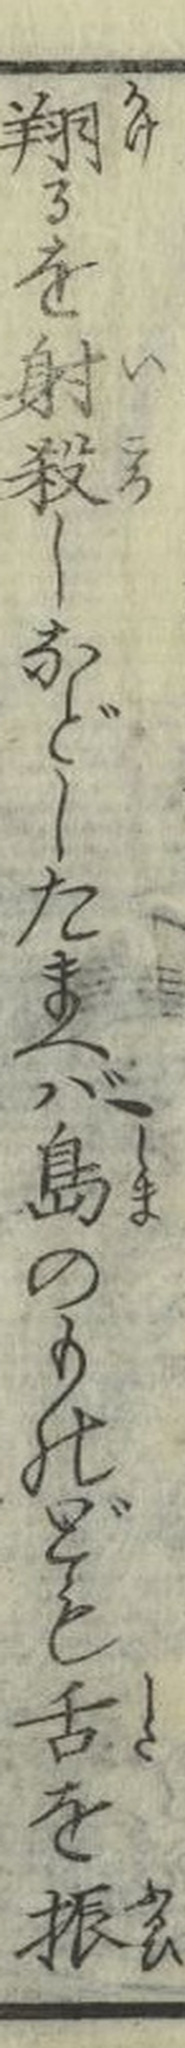翔るを射殺しなどしたまへば、島のものども舌を振
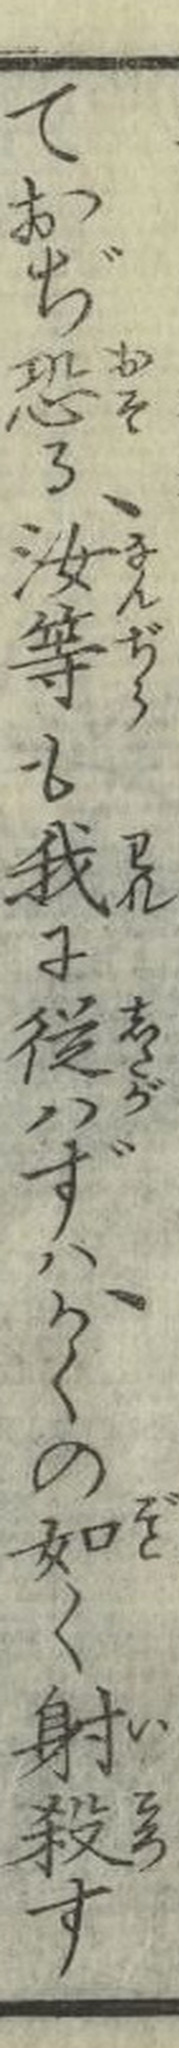ておぢ恐る、汝等も我に従はずは、かくの如く射殺す
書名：琉球入貢紀畧
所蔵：University of the Ryukyus Library
